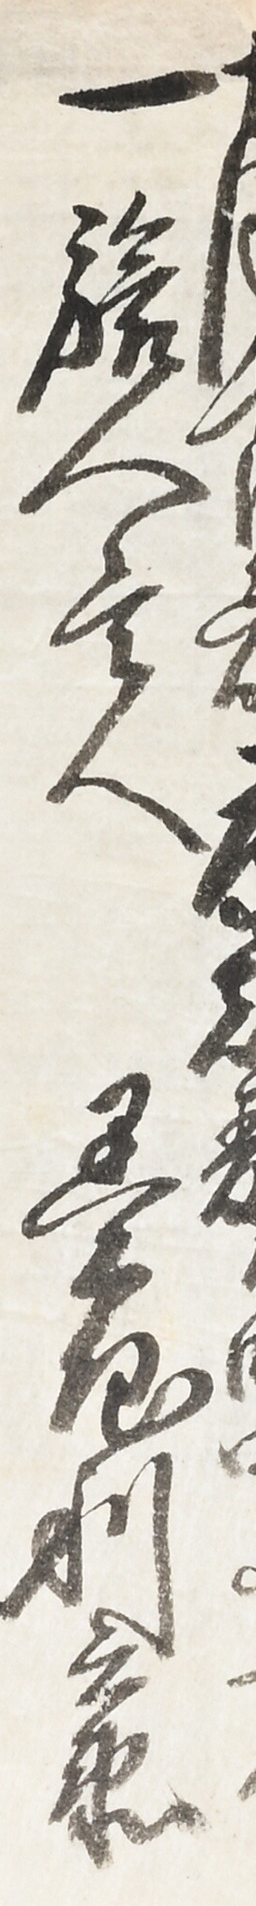一旅人壱人墨屋利兵衛
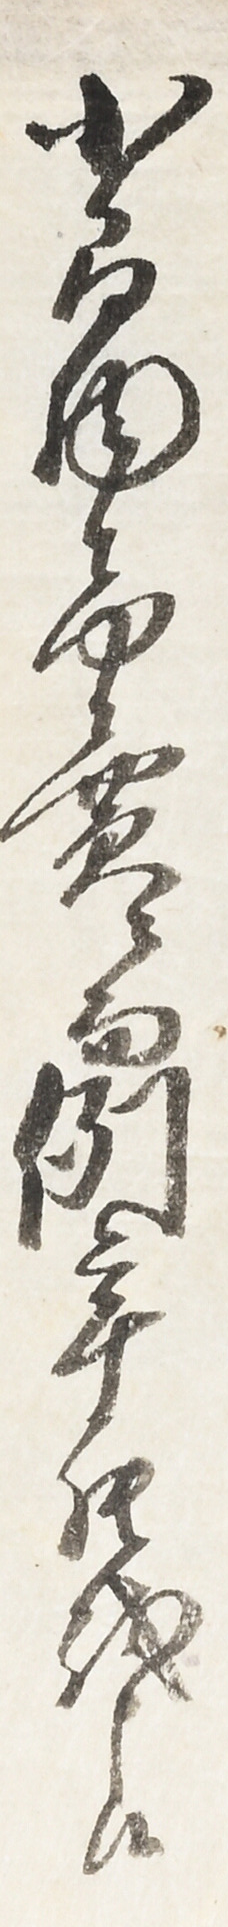小間物商売ニ而例年罷越申候
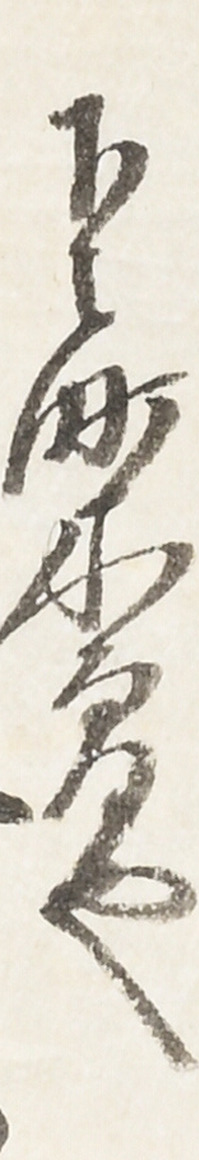下モ町木曽や
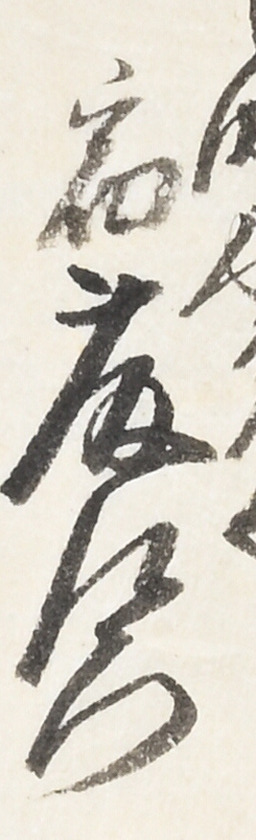宿籐左衛門
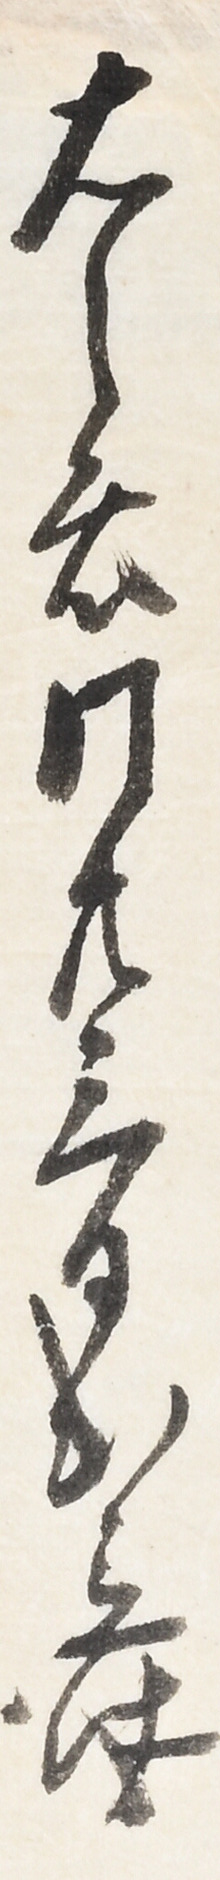右之者同廿三日出立仕候
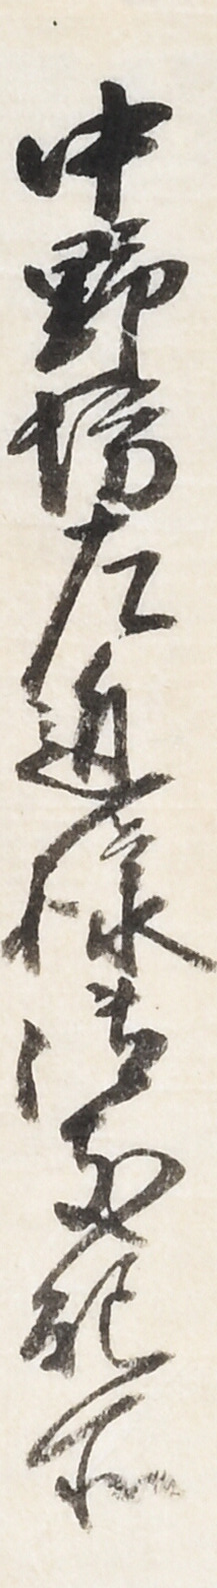中野坊左近様御支配所
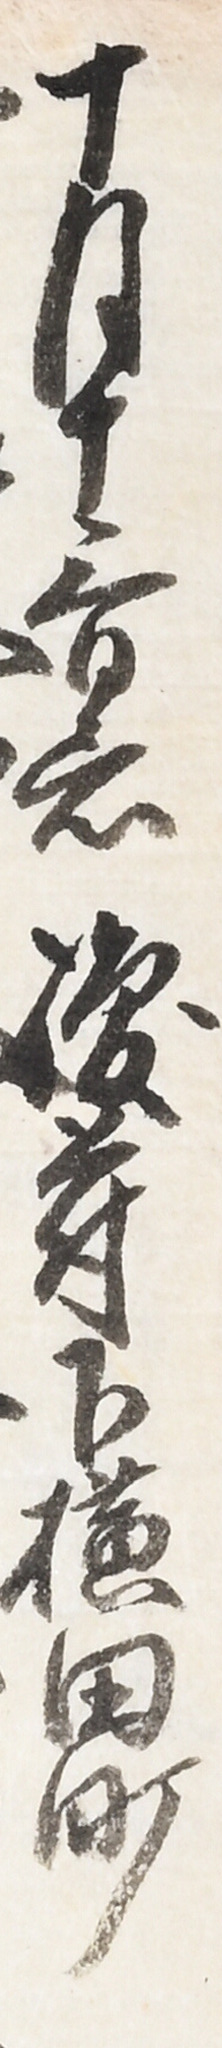十月十三日着駿府下横田町
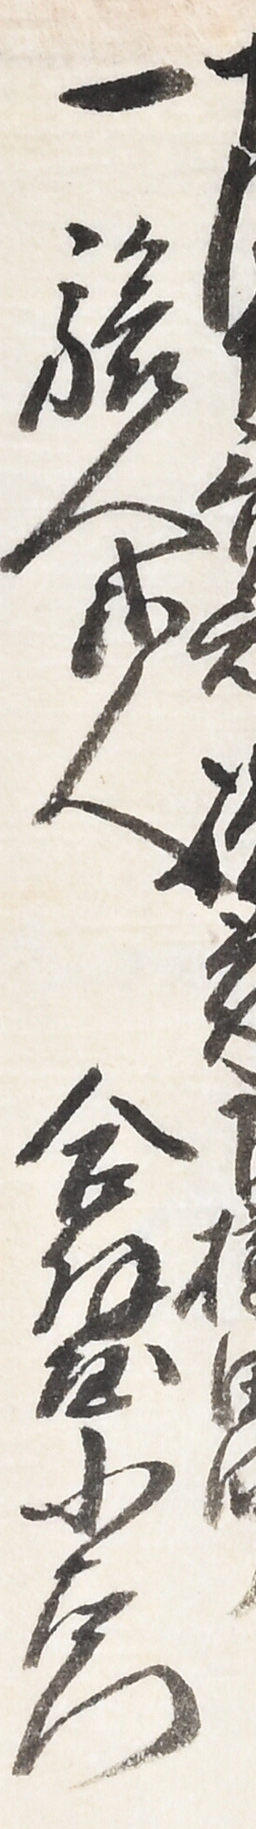一旅人弐人合羽屋小右衛門
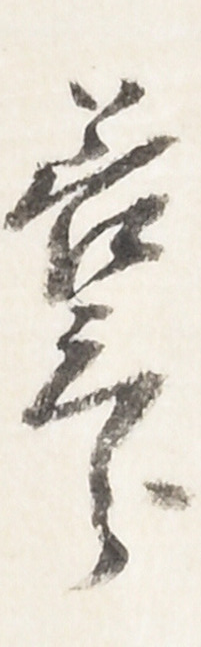善三郎
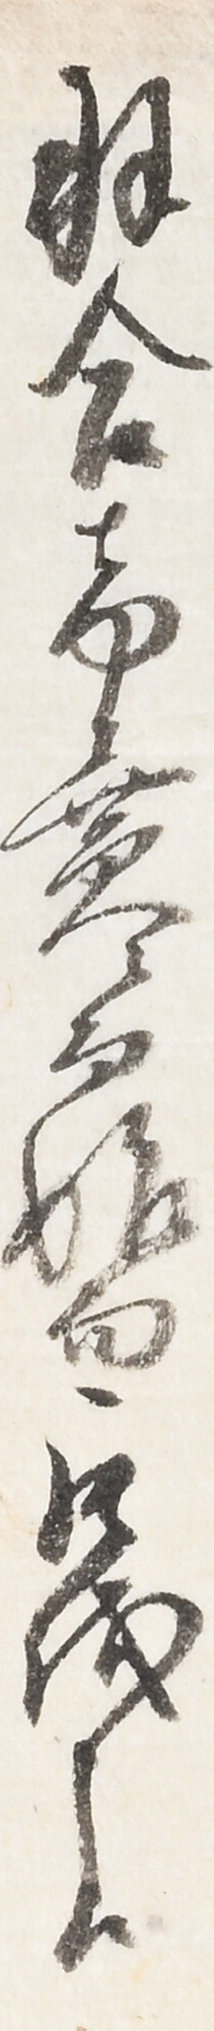羽合商売ニ而始而罷越申候
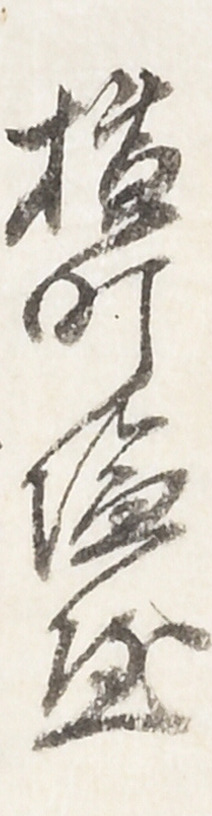横町塩屋
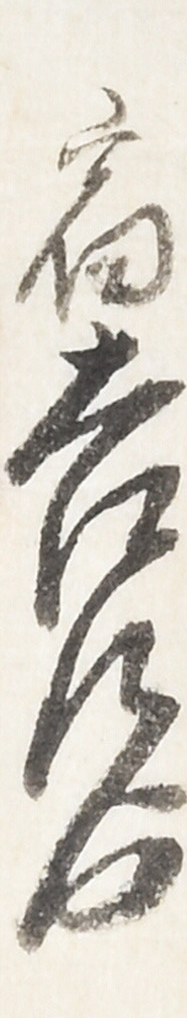宿吉左衛門
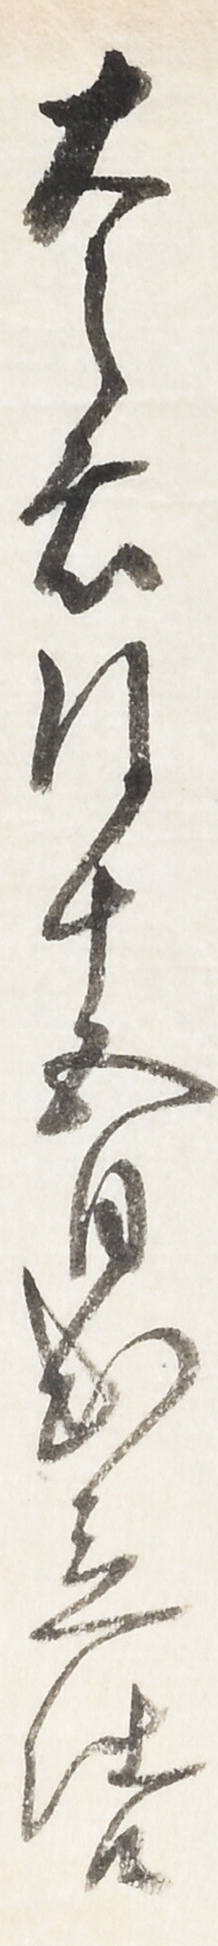右之者同十五日出立仕候
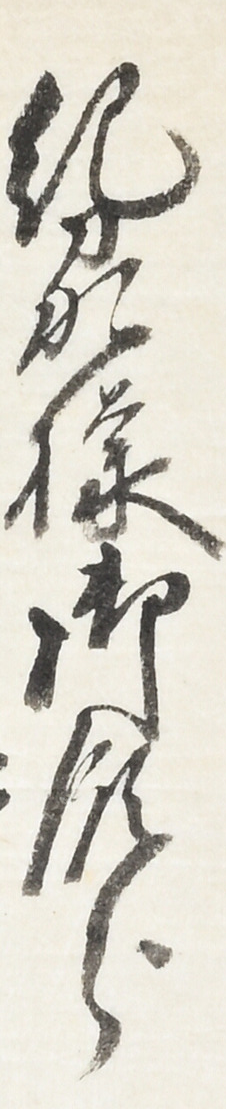紀州様御領分
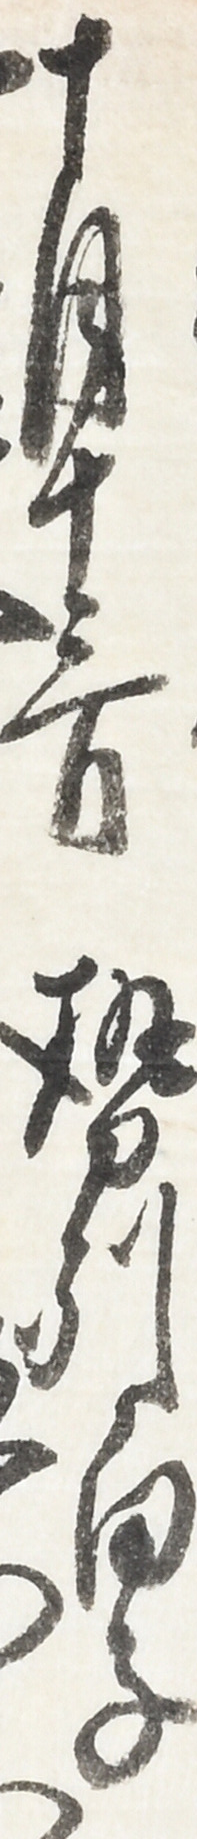十月十三日勢州白子
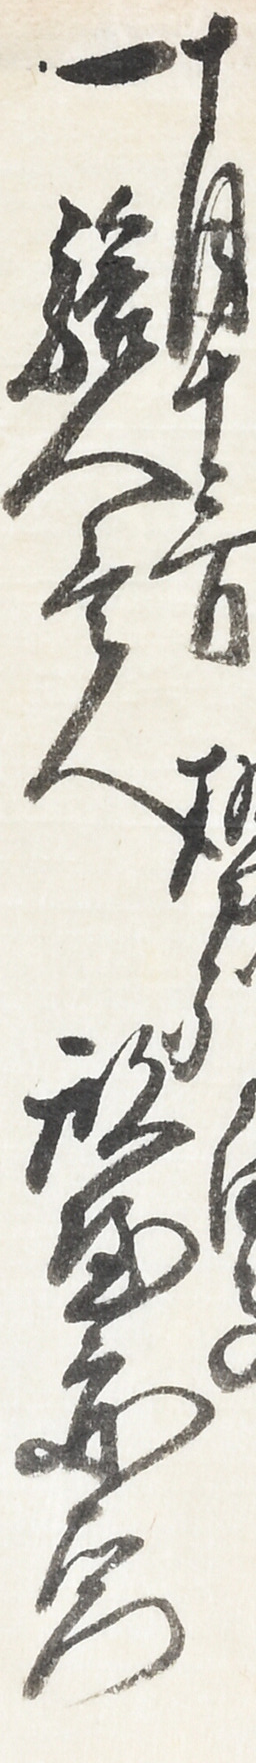一旅人壱人形屋亦右衛門
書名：旅人泊控帳
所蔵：伊那市立高遠町図書館・合同会社AMANE
